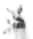之
